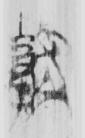{㱿子禾}
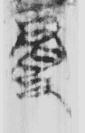曼
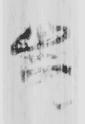生
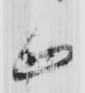㠯（以）
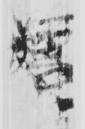{疒次}
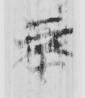不
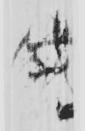成
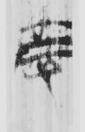皮
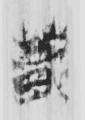萅
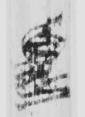{日止頁}
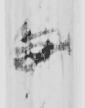{日禾}
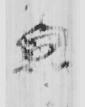{各日}
